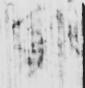○（爨）
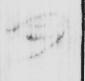月
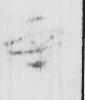辛
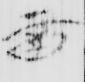梄（酉）
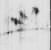之
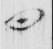日
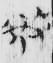敓
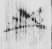之
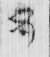邑
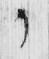人
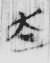走
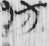仿
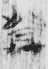登
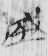城（成）
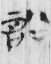訟
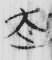走
